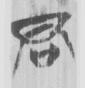君
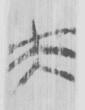夫
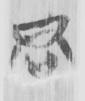君
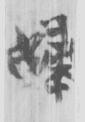婦
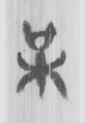某
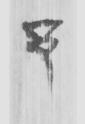邑
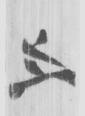之
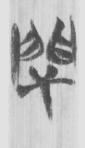{門干}
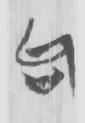句
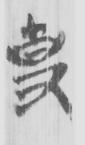吏
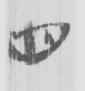四
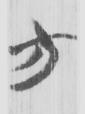方
